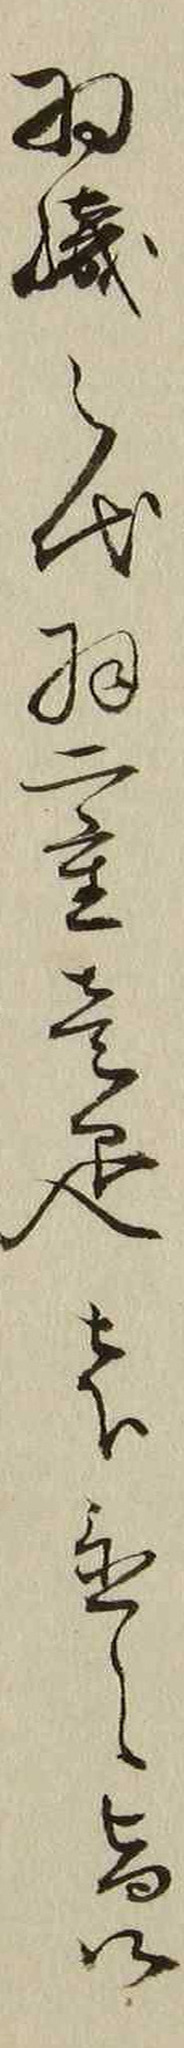羽織之代羽二重壱疋被下置候旨御
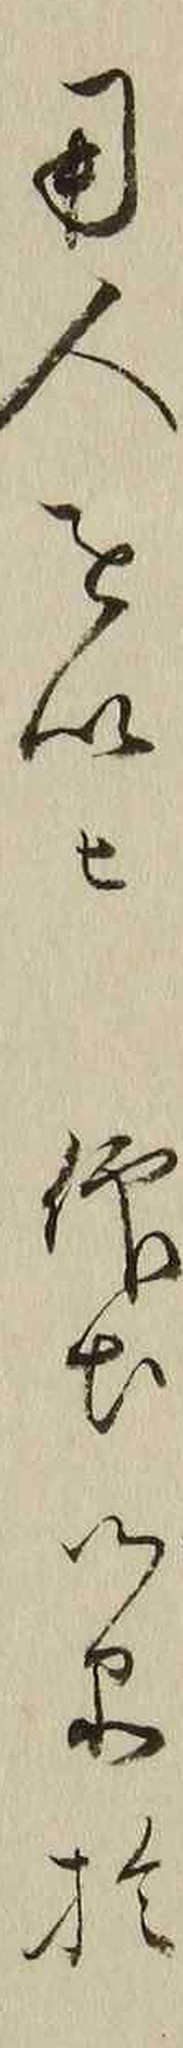用人を以被仰出御品於
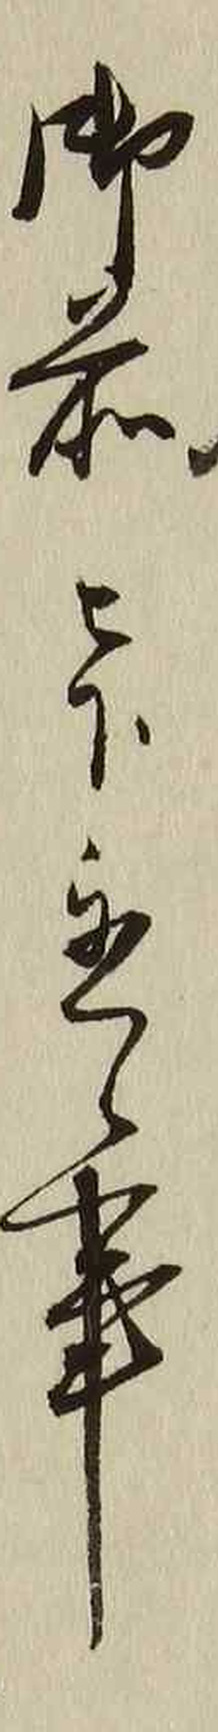御前被下置候事
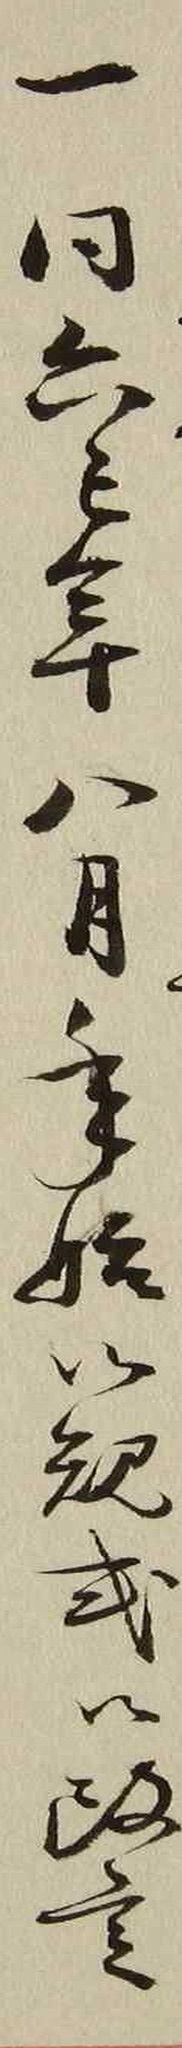一同六巳年八月年始御規式御改定
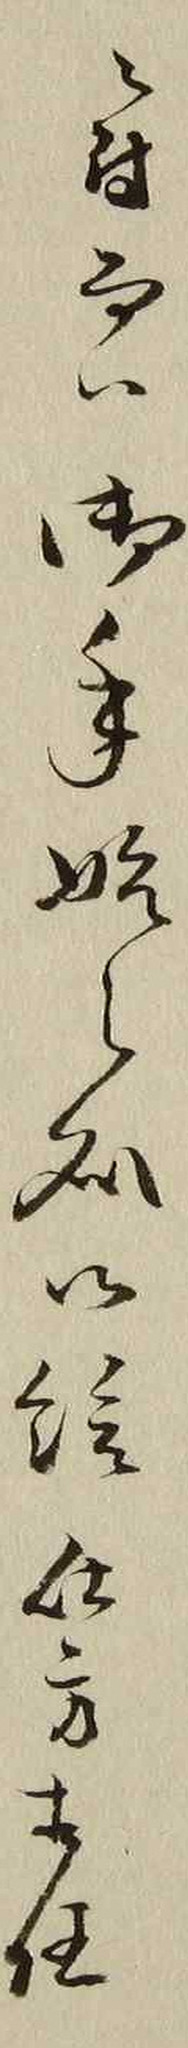に付而は御年始之処御給仕方相任
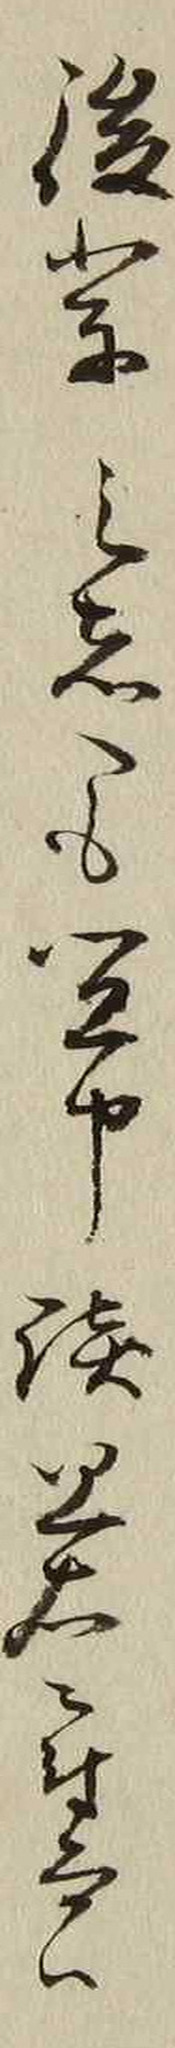後輩之者へも宜申談同上右に付而は
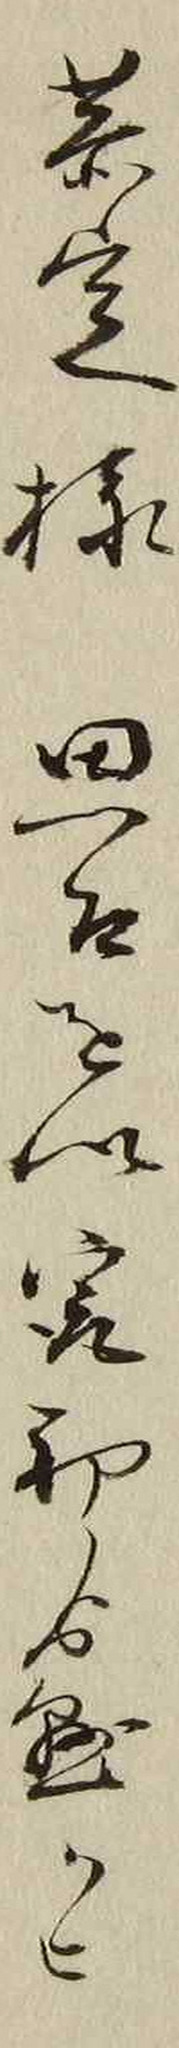恭定様思召を以最初ゟ懸り被
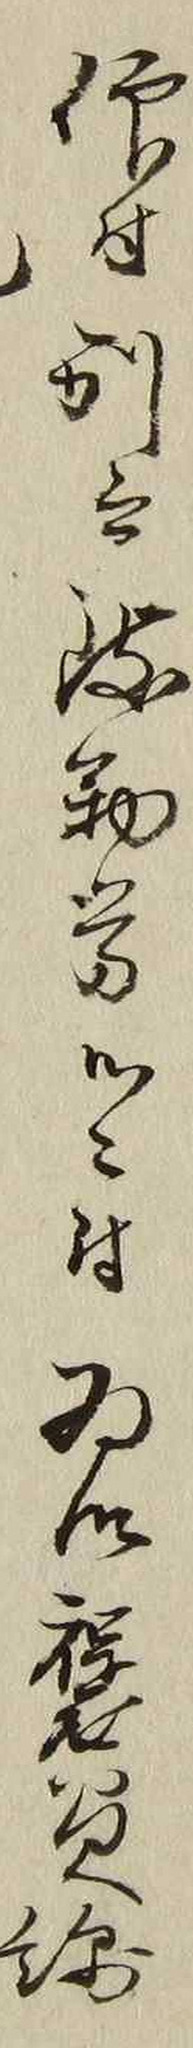被仰付別而致勤労候に付為御褒美綿
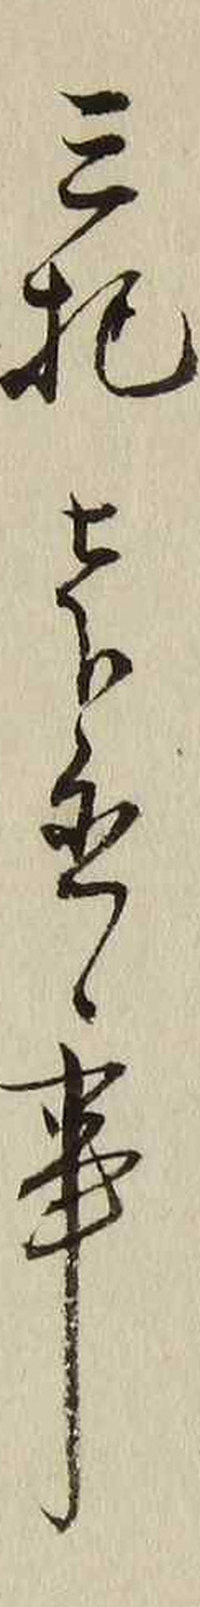三把被下置候事
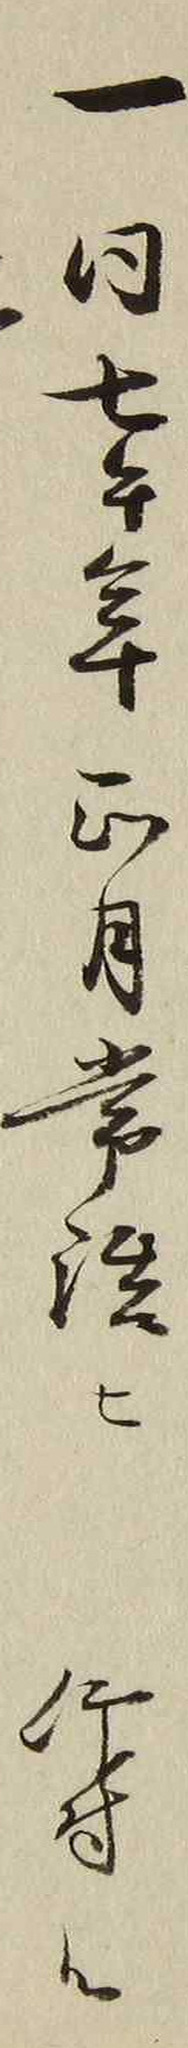一同七午年正月常詰被仰付候
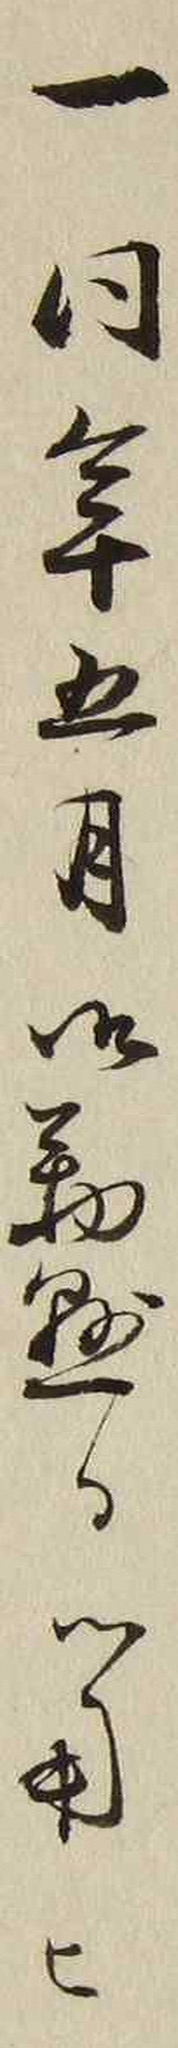一同年五月御勤懸り御用被
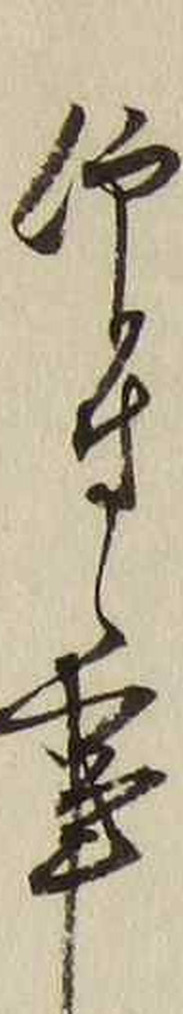仰付候事
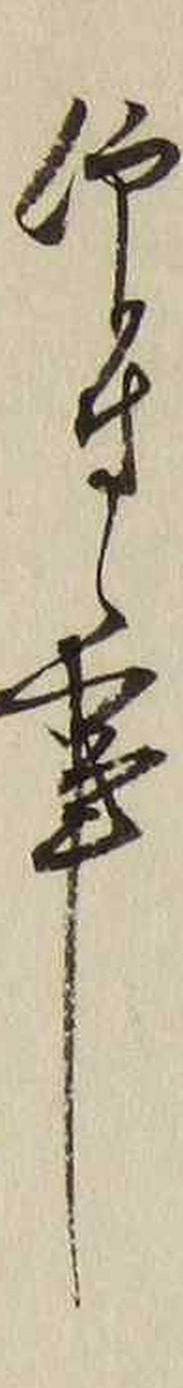仰付候事
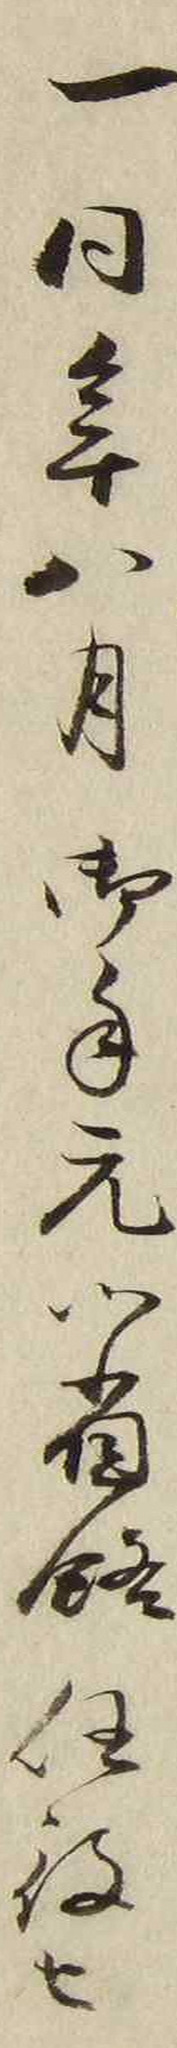一同年八月御手元御省略任役被

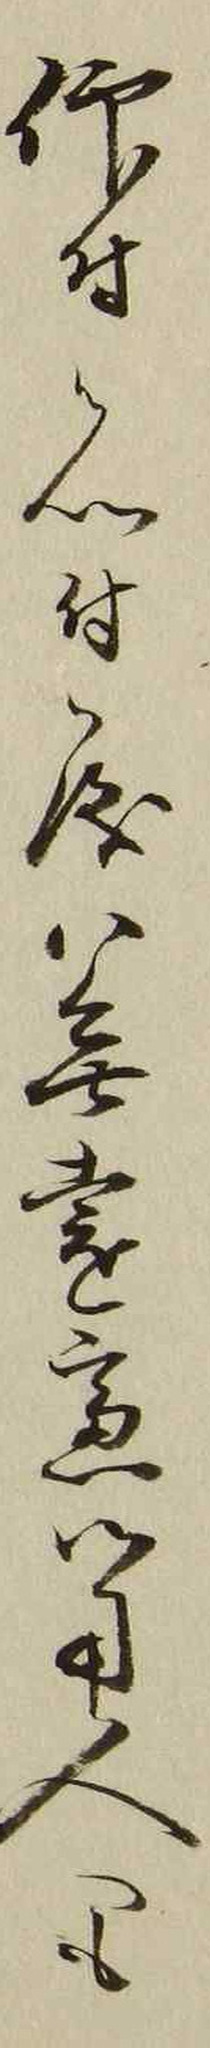仰付御心付之儀は無遠慮御用人へも
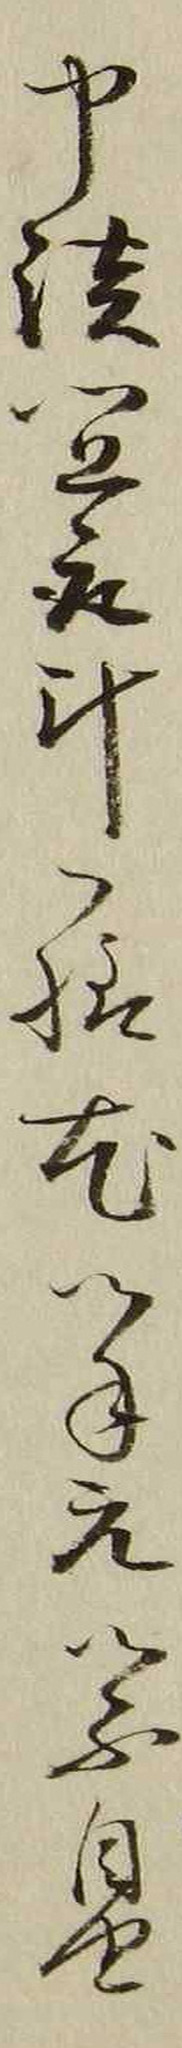申談宜取斗候様尤御手元不自由
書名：諸士系譜　巻之292　き之部1
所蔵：会津若松市立会津図書館
